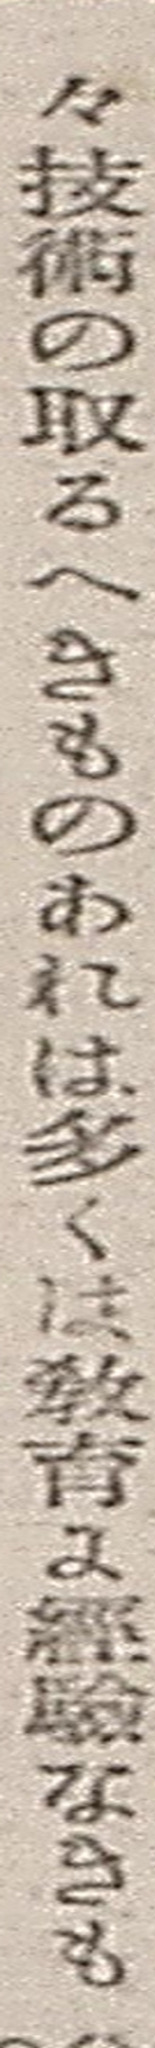々技術の取るへきものあれは多くは教育に経験なきも
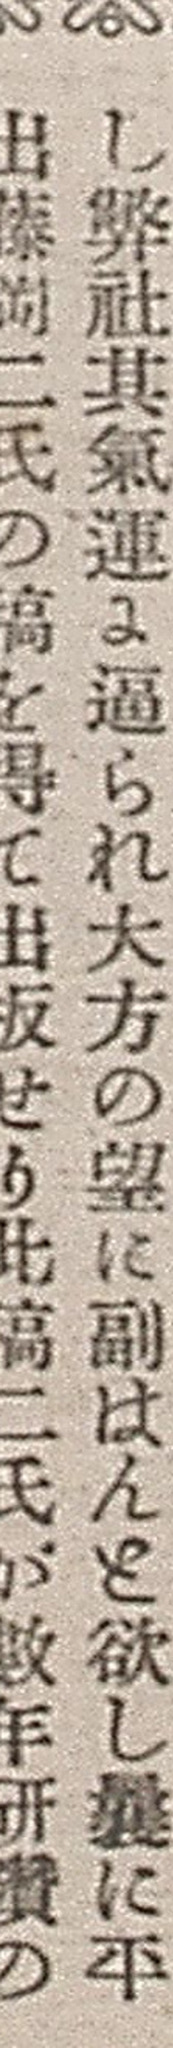し弊社其気運に逼られ大方の望に副はんと欲し曩に平
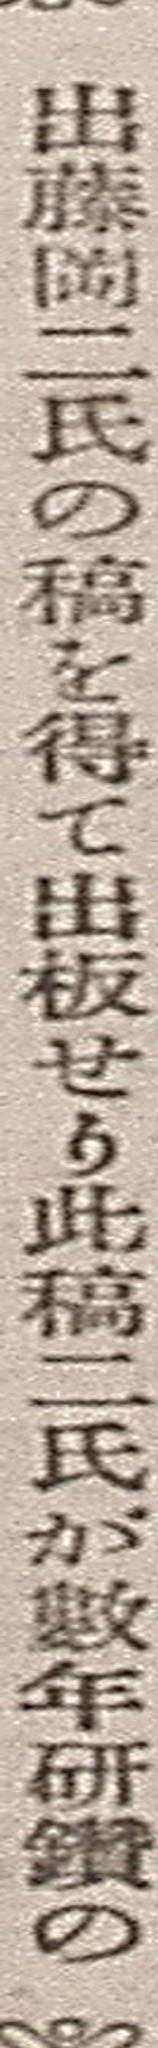出藤岡二氏の稿を得て出版せり此稿二氏が数年研鑽の
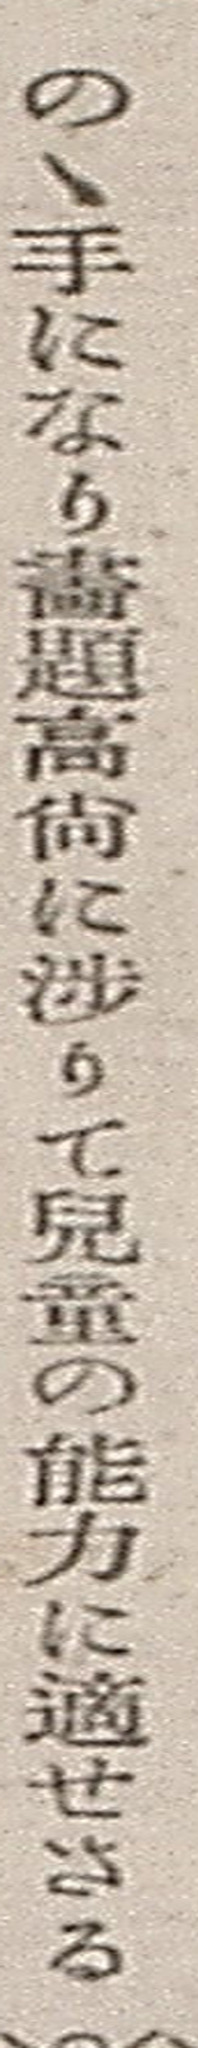のゝ手になり畫題高尚に渉りて兒童の能力に適せさる
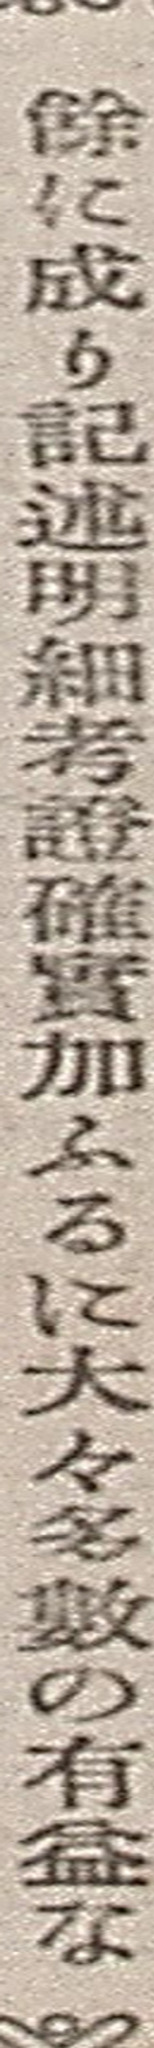餘に成り記述明細考證確実加ふるに大々多数の有益な
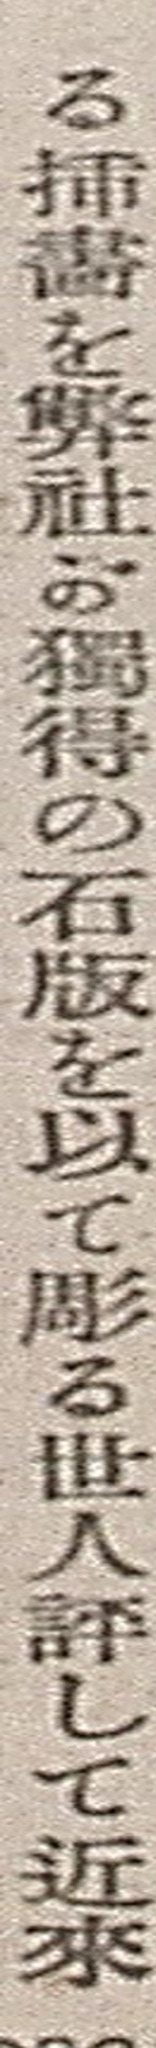る挿畫を弊社が独特の石版を以て彫る世人評して近来
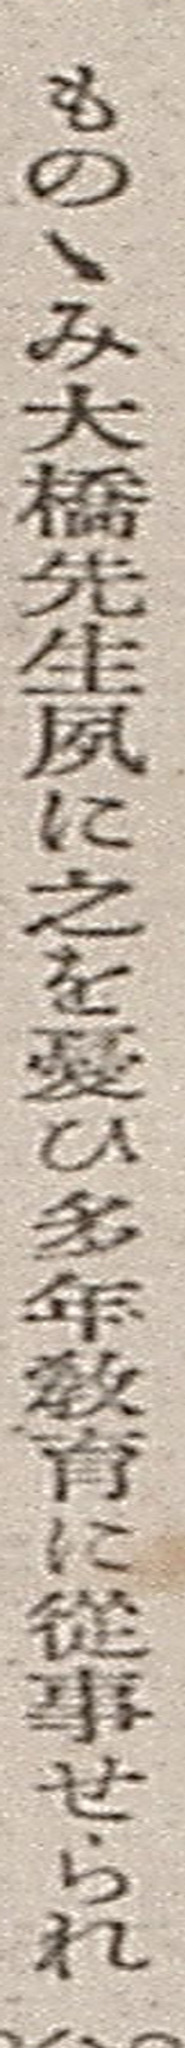ものゝみ大橋先生夙に之を憂ひ多年教育に従事せられ
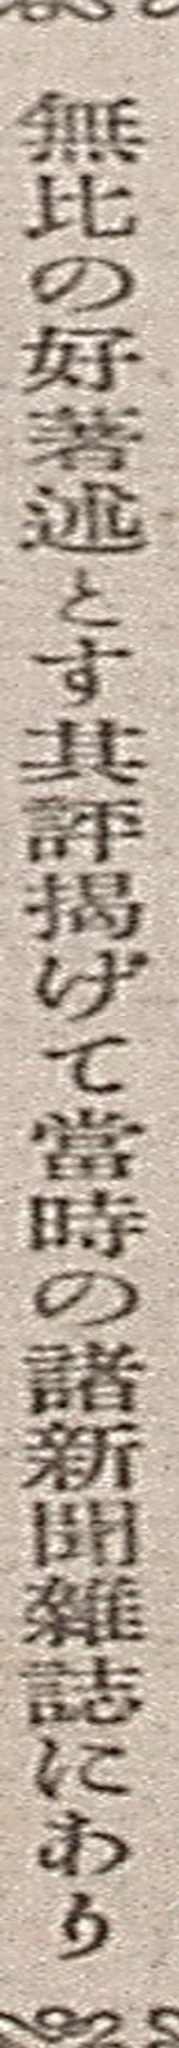無比の好著述とす其評揚げて当時の諸新聞雑誌にあり
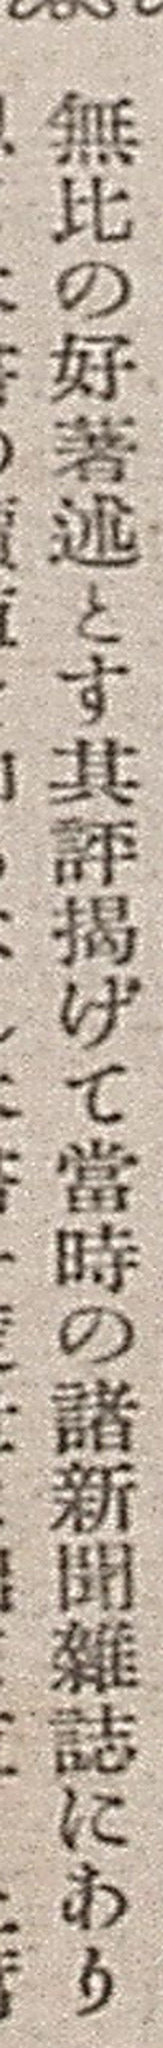無比の好著述とす其評揚げて当時の諸新聞雑誌にあり
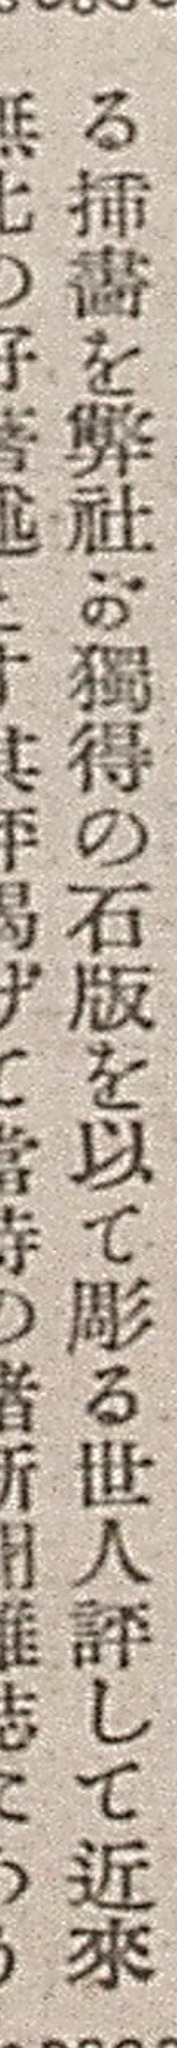る挿畫を弊社が独特の石版を以て彫る世人評して近来
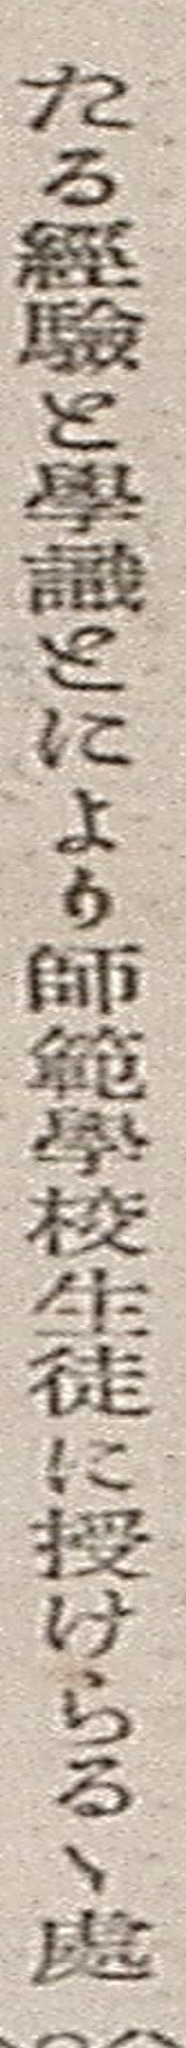たる経験と学識とにより師範学校生徒に授けらるゝ処
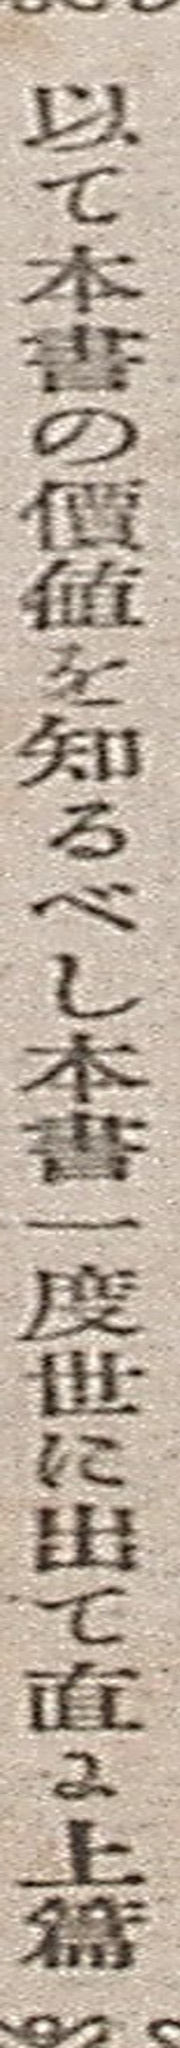以て本書の価値を知るべし本書一度世に出て直に上編
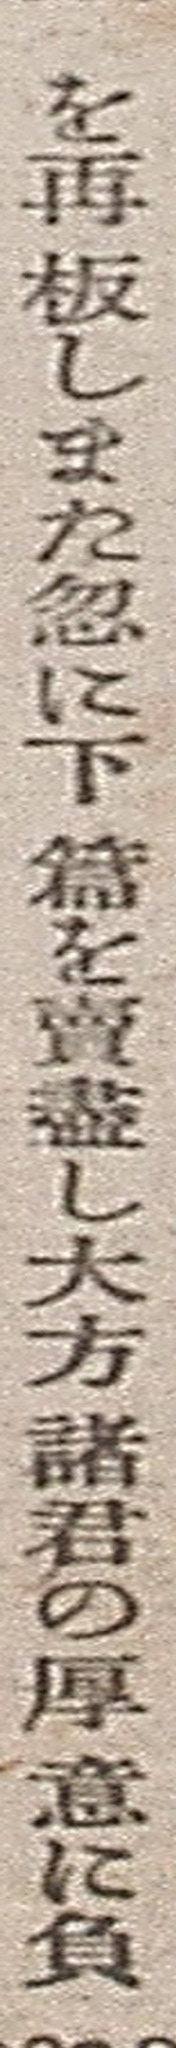を再版しまた忽に下編を売盡し大方諸君の厚意に負
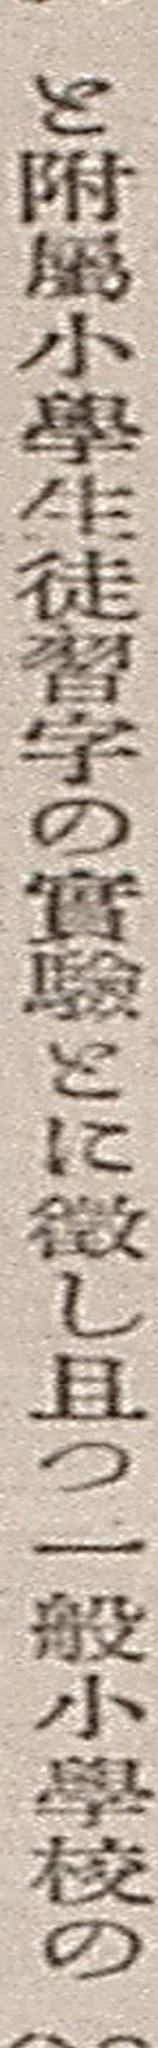と附属小学校生徒習字の実験とに徴し且つ一般小学校の
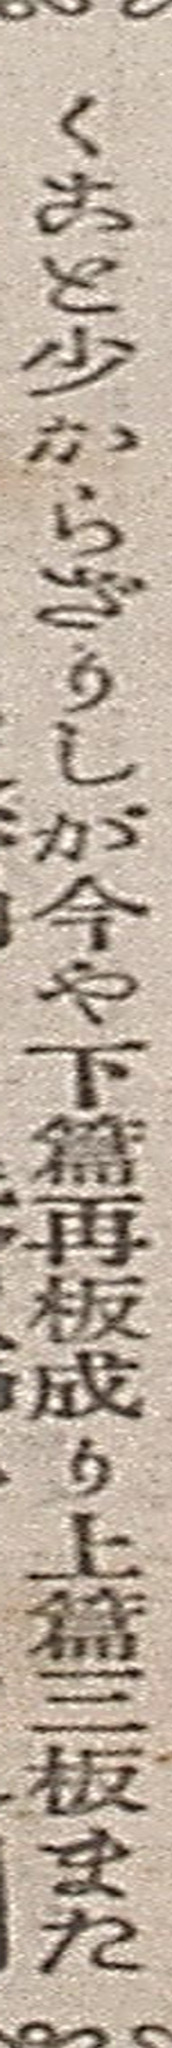くこと少からざりしが今や下編再版成り上編三板また
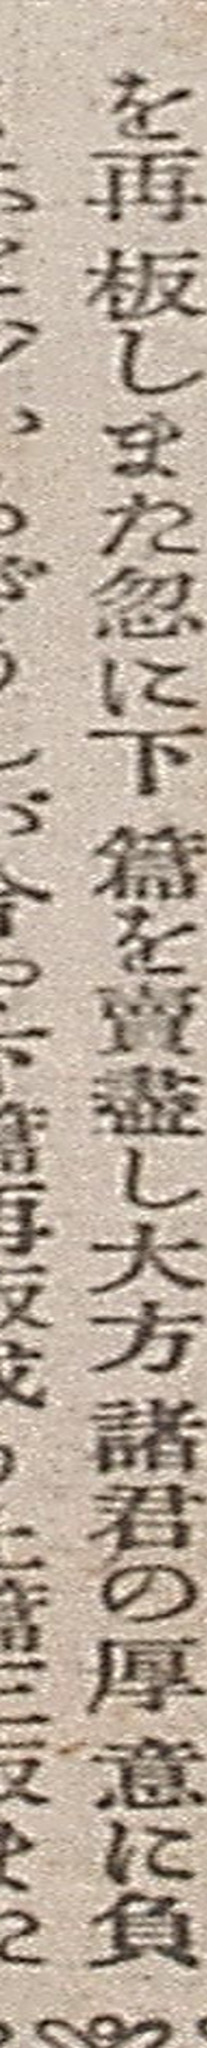を再版しまた忽に下編を売盡し大方諸君の厚意に負
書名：風俗畫報臨時増刊第百二十八號　洪水被害録（下）
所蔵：東京大学地震研究所図書室 Earthquake Research Institute Library, The University of Tokyo, JAPAN
